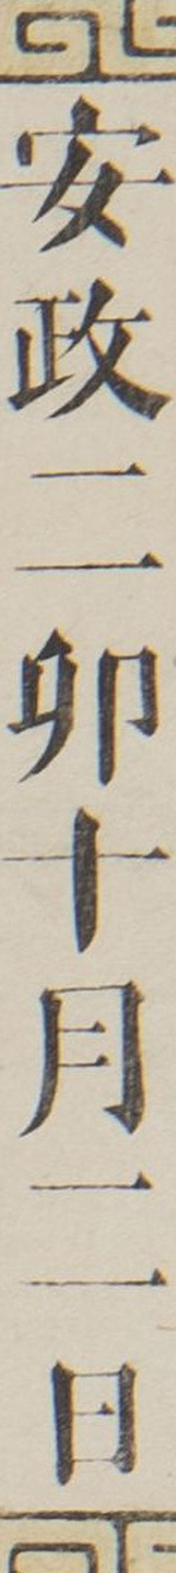安政二卯十月二日
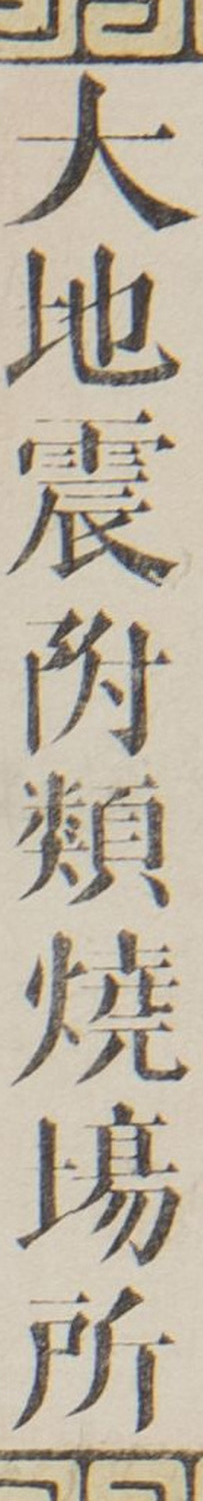大地震附類焼場所
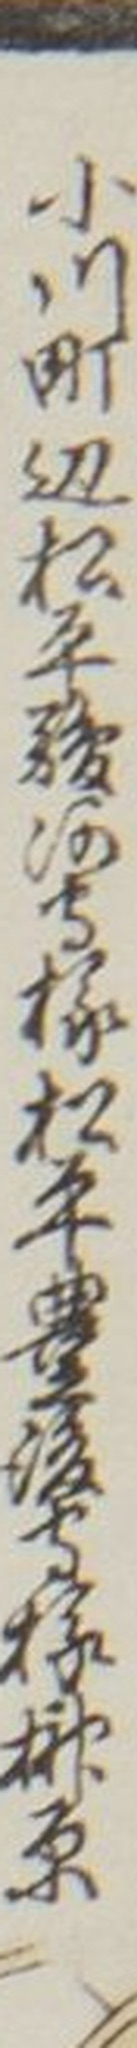小川町辺松平駿河守様松平豊後守様榊原
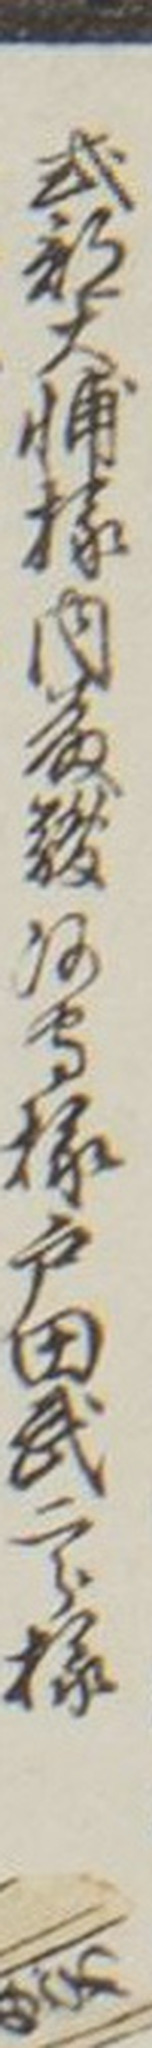式部大輔様内藤駿河守様戸田武二郎様
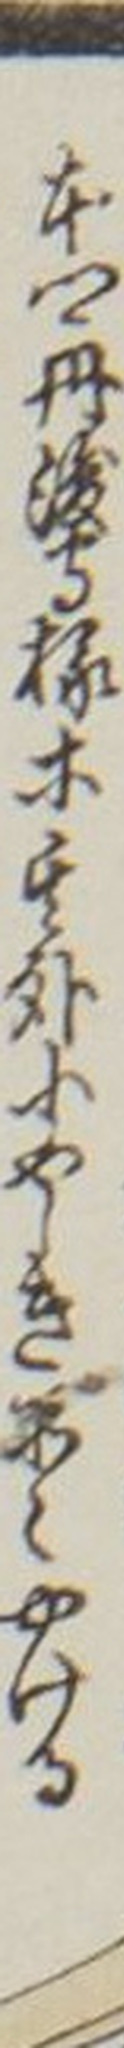本郷丹後守様等其外小やしき所々やける
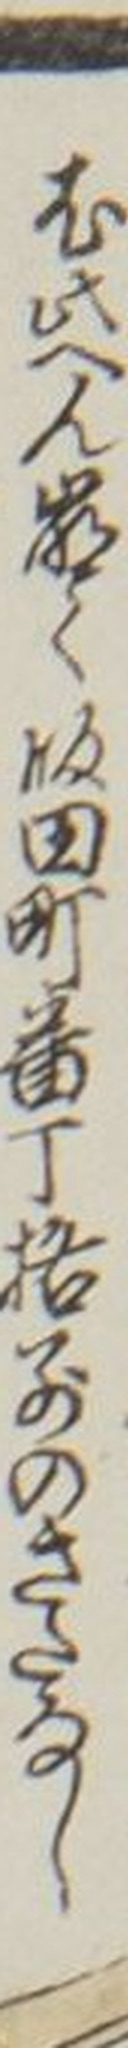尤此へん崩て飯田町番丁格別のさたなし
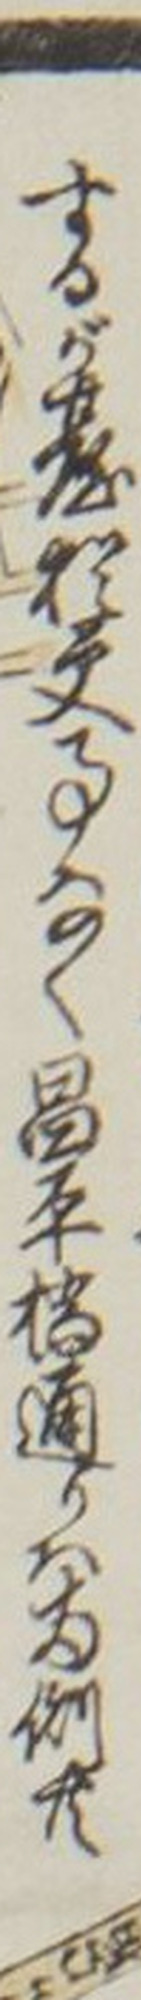するが台猶更事なく昌平橋通りは両側共
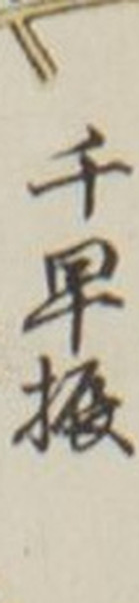千早振
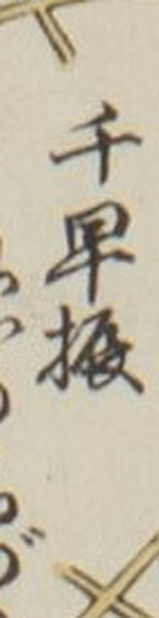千早振
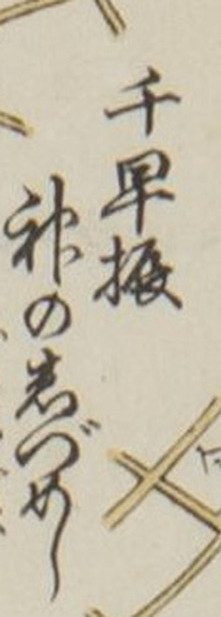神のしづめし
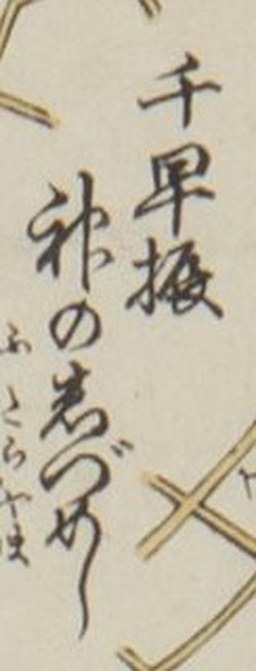神のしづめし
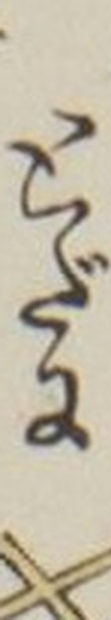とだに
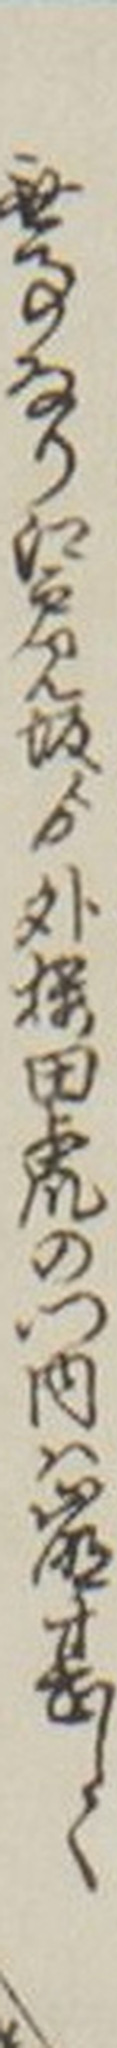無事なり江戸見坂より外桜田虎の門内は崩甚しく
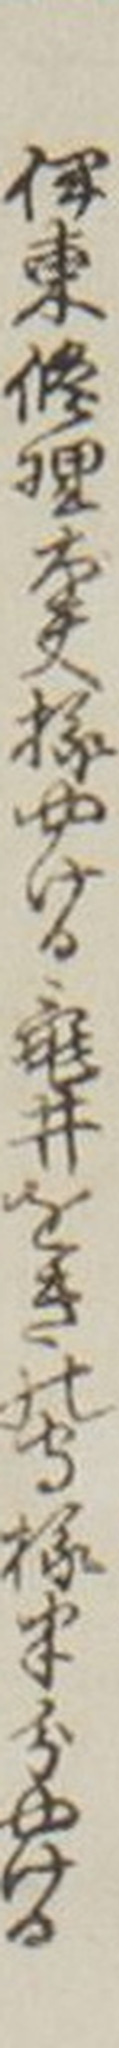伊東修理大夫様やける亀井をきの守様半分やける
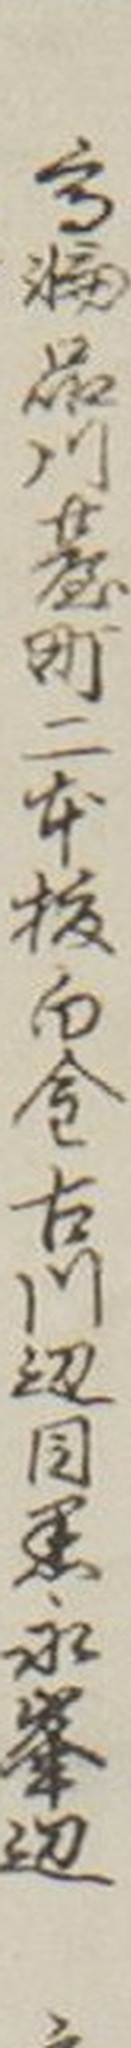高輪品川台町二本榎白金古川辺目黒永峯辺
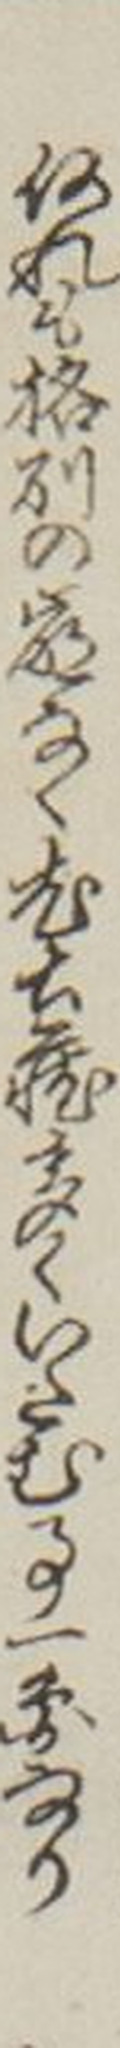何れも格別の崩なく尤土蔵多くいたむ事一円なり
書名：安政二年十月二日大地震附類焼場所
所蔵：あいおいニッセイ同和損保株式会社
